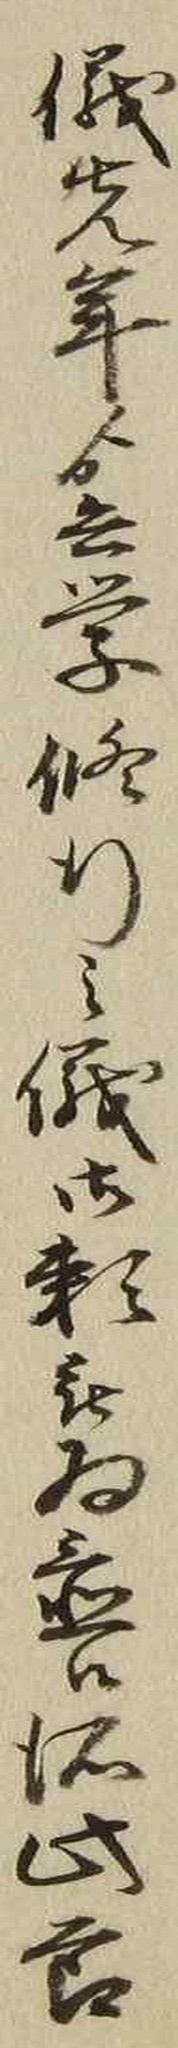儀先年ゟ兵学修行之儀御頼被為置候所此節
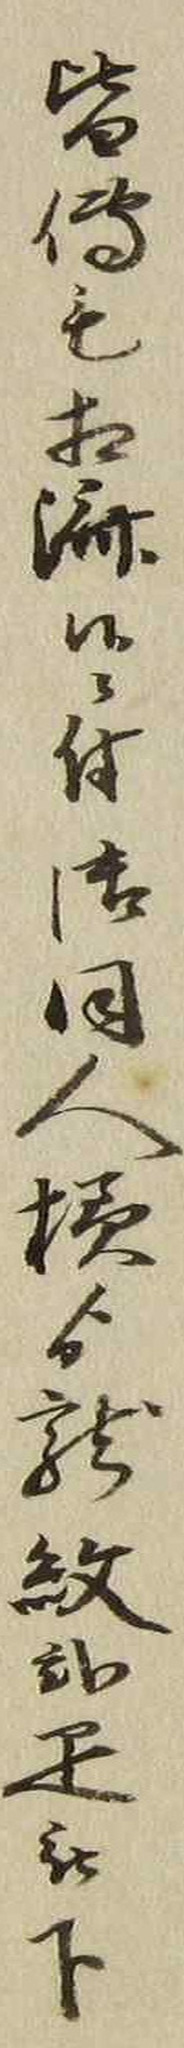皆伝も相済候に付御同人様ゟ竜紋弐疋被下
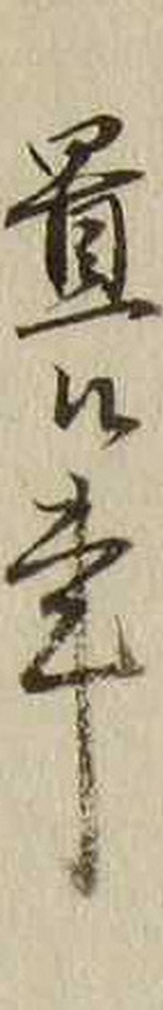置候事
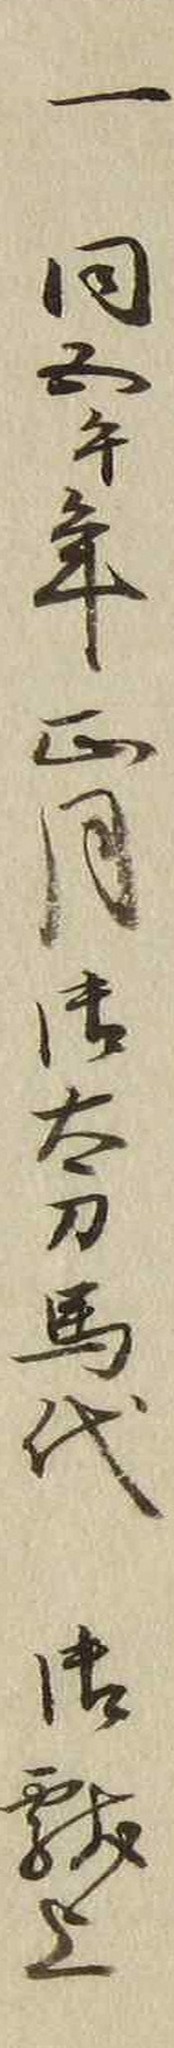一同五午年正月御太刀馬代御献上
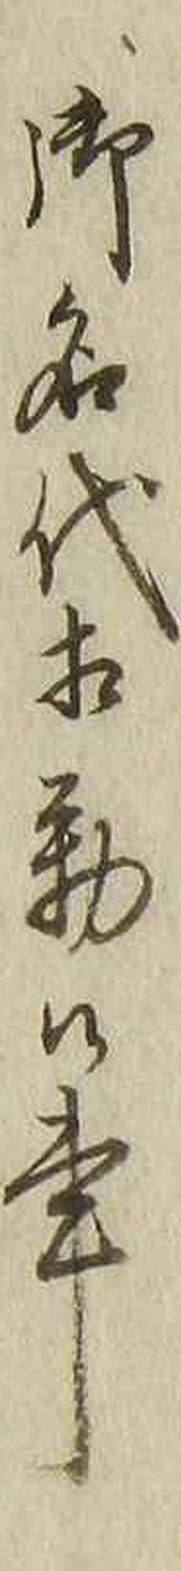御名代相勤候事
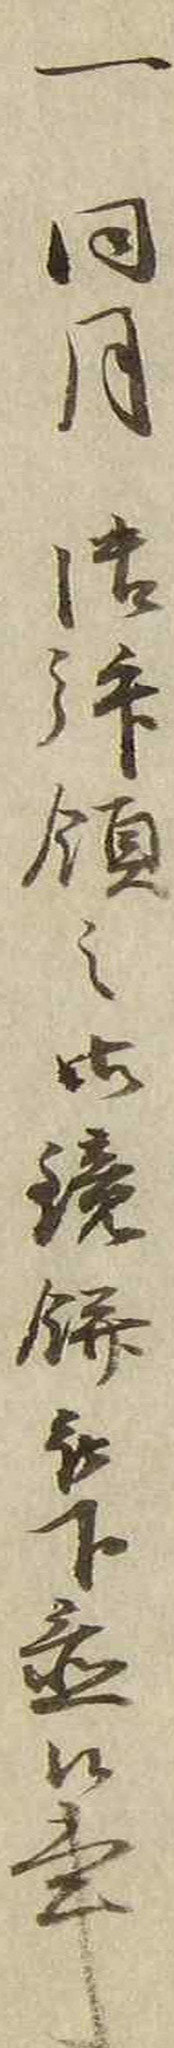一同月御拝領之御鏡餅被下置候事

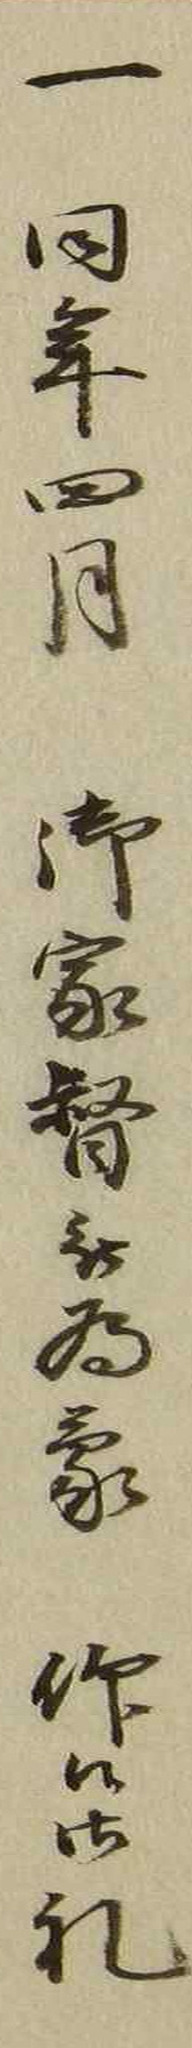一同年四月御家督被為蒙仰候御礼
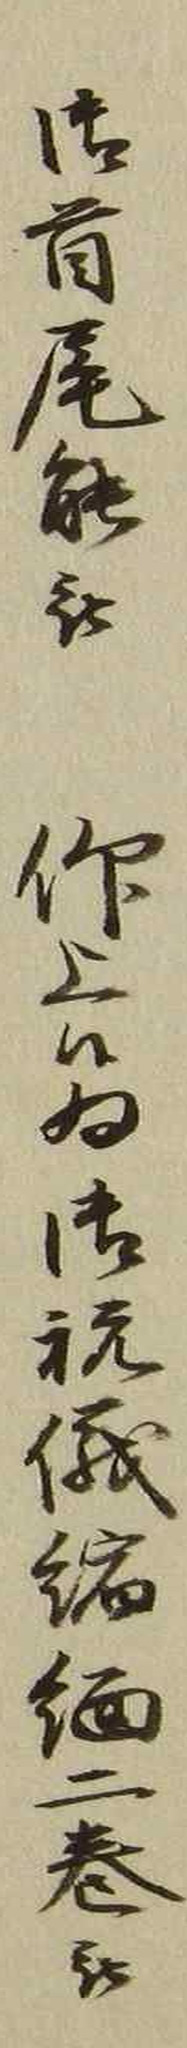御首尾能被仰上侯為御祝儀縮緬二巻被
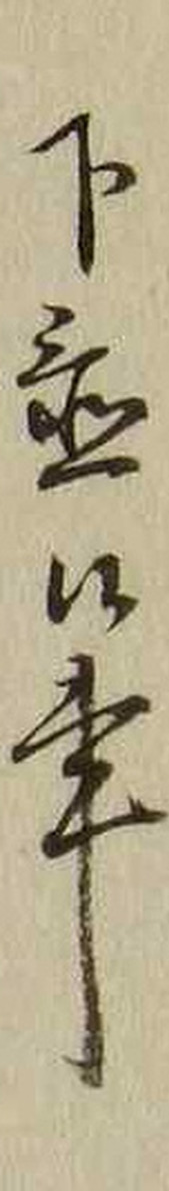下置候事
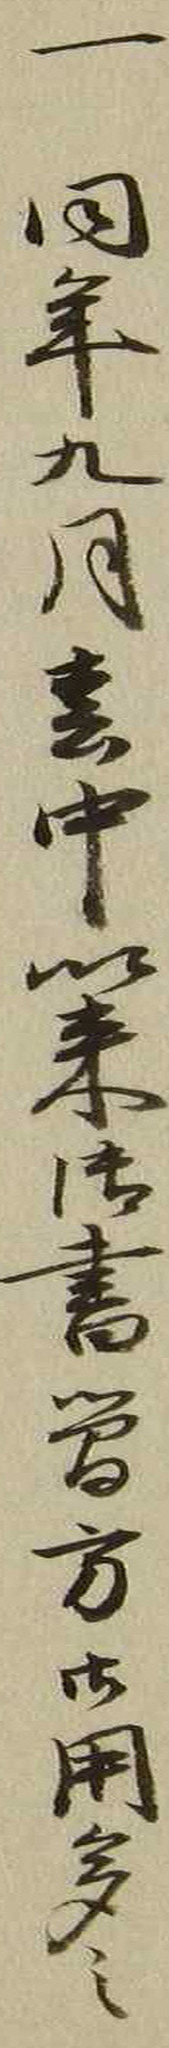一同年九月春中以来御書簡方御用多之
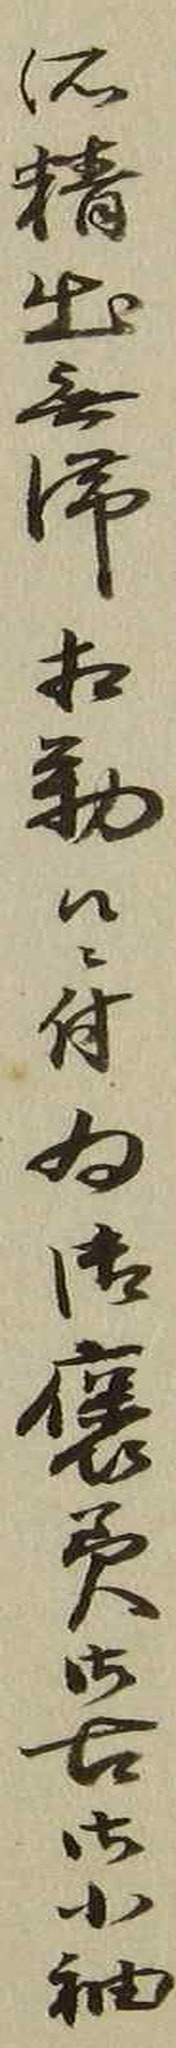所精出無滞相勤候に付為御褒美御古御小袖
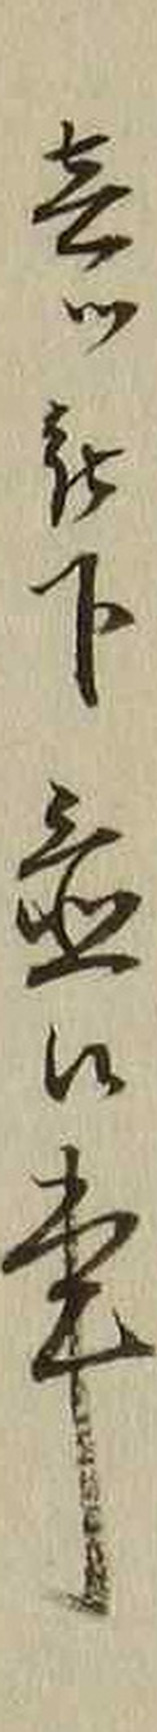壱つ被下置候事
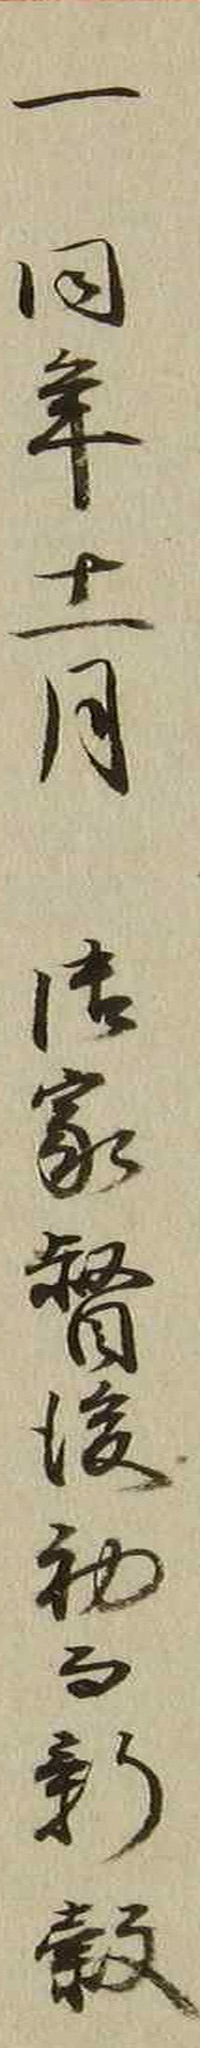一同年十一月御家督後初而新穀
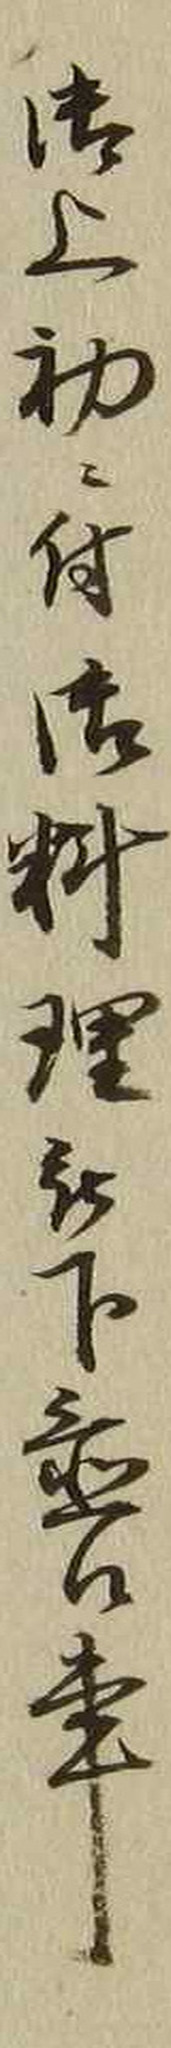御上初に付御料理被下置候事
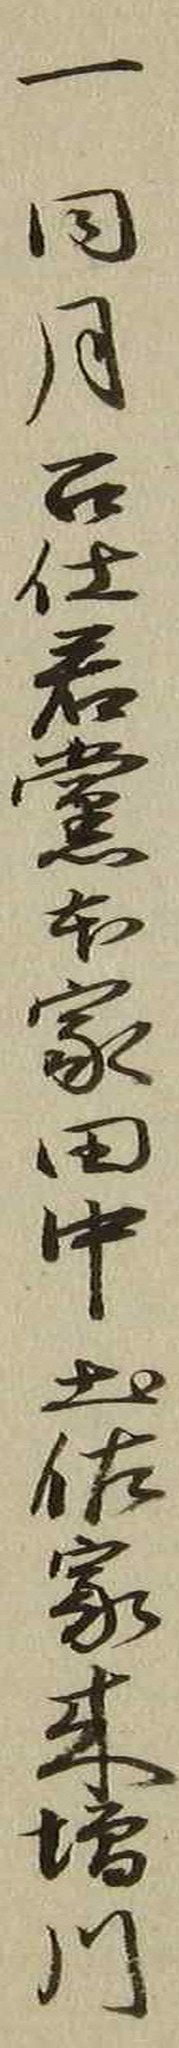一同月召仕若党本家田中土佐家来増川
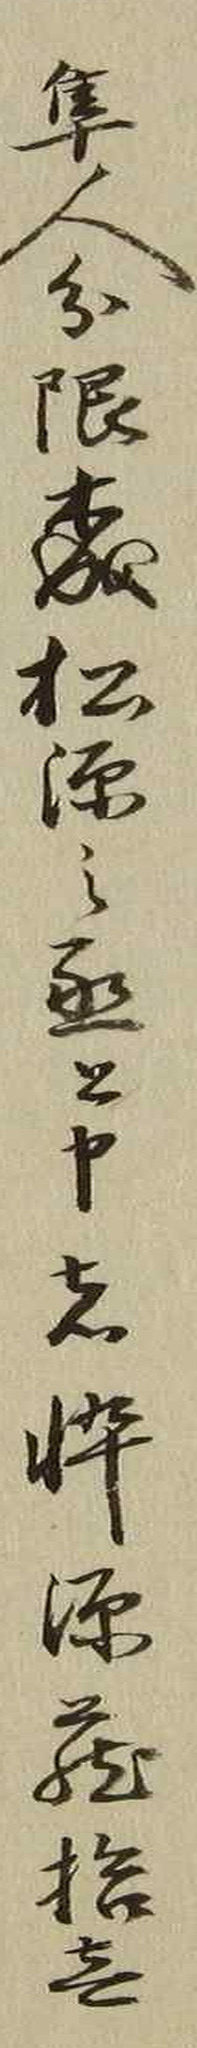隼人分限森松源之丞と申者忰源蔵拾壱
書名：諸士系譜　巻之133　た之部9
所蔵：会津若松市立会津図書館
